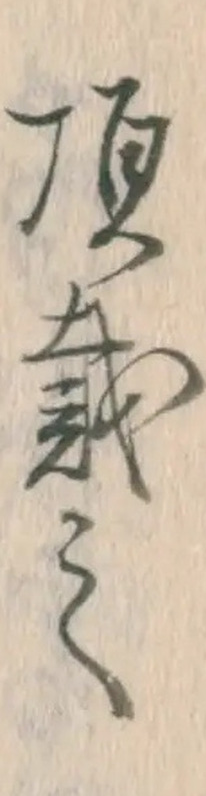頂戴之
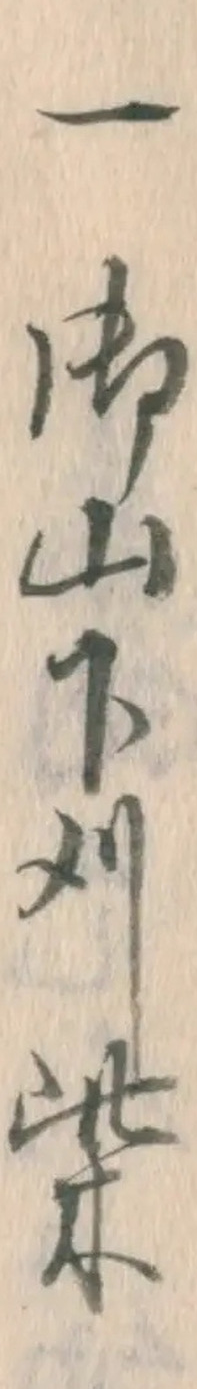一御山下刈柴
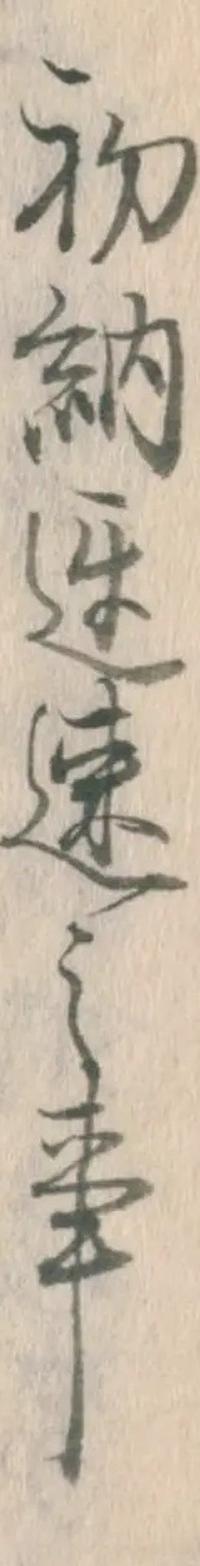初納遅速之事
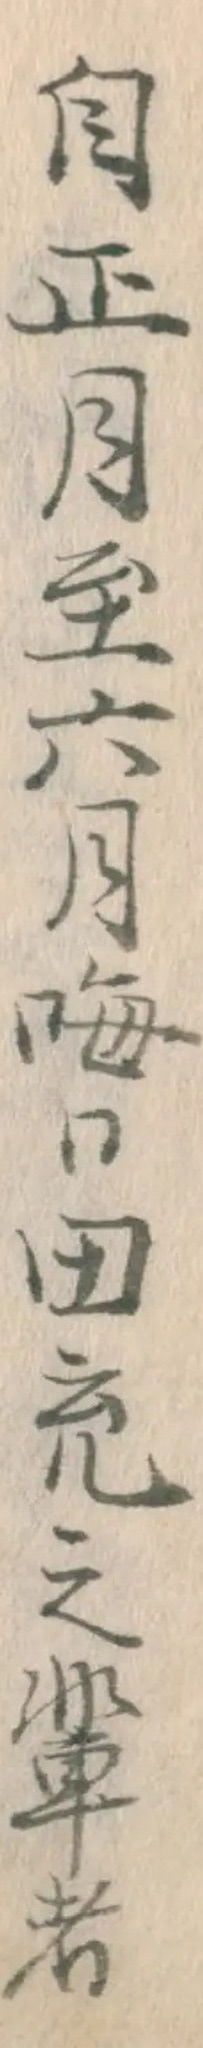自正月至六月晦日田充之輩は
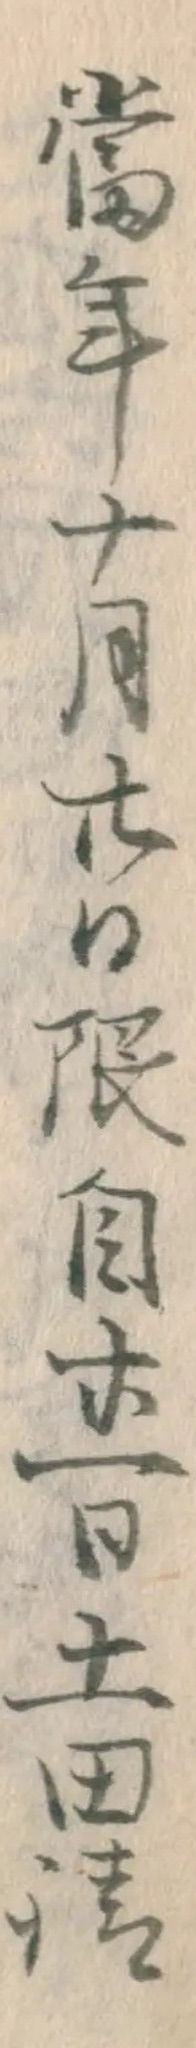當年十月廿日限自廿一日土田請
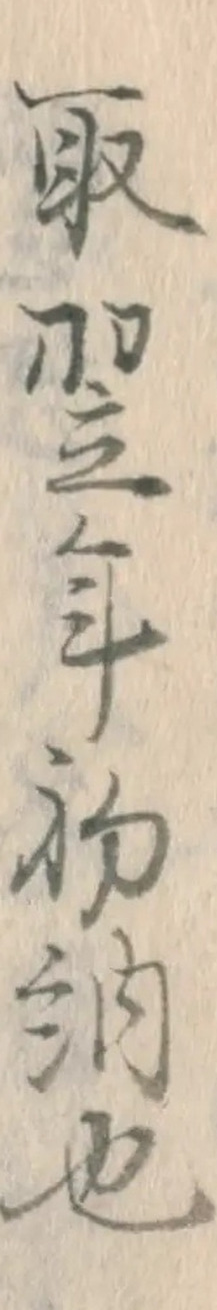取翌年初納也
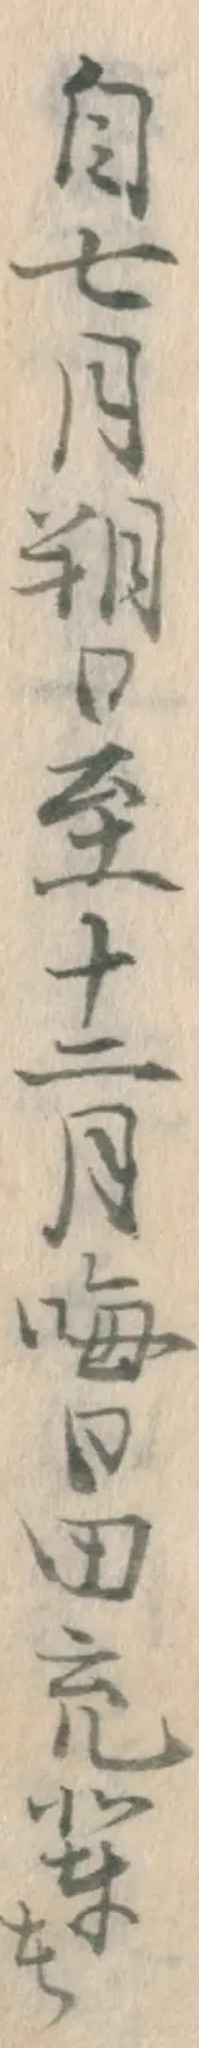自七月朔日至十二月晦日田宛輩は
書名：賀茂社記録. 第81冊
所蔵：国立国会図書館 National Diet Library, JAPAN
